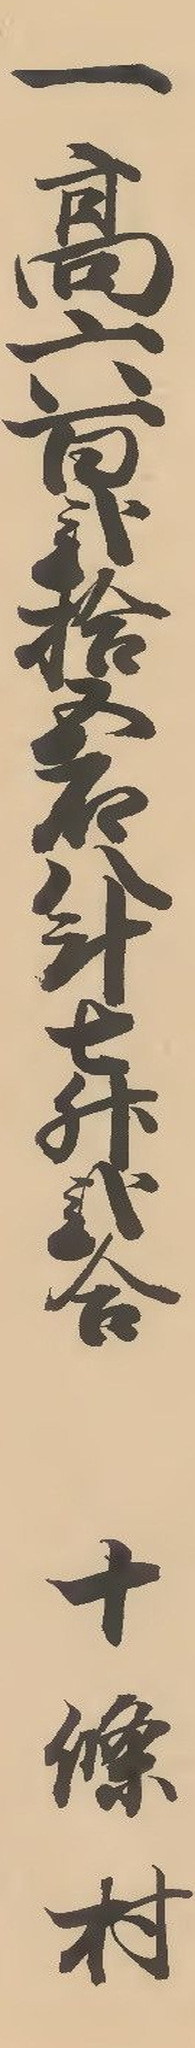一髙六百弐拾五石八斗七升弐合十條村
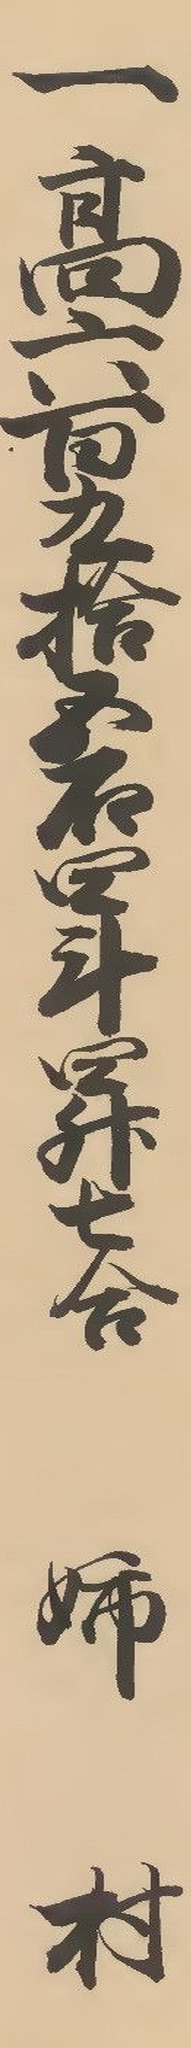一髙六百九拾五石四斗四升七合姉村
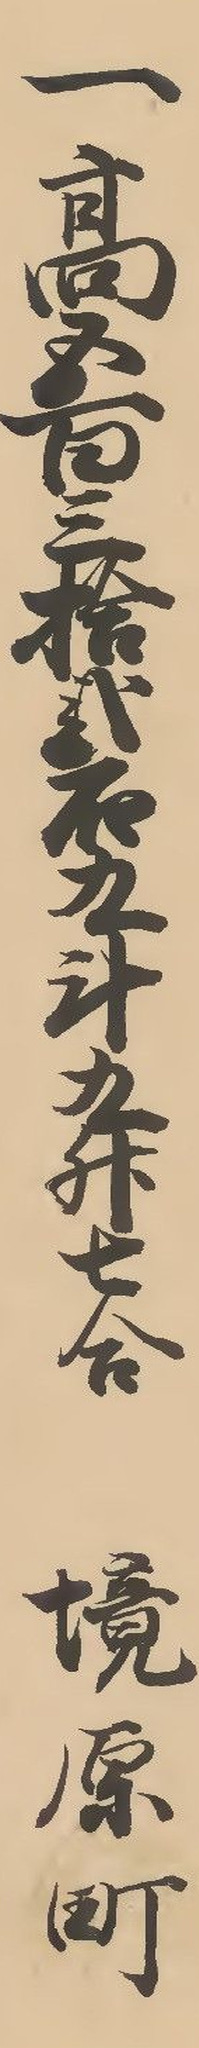一髙五百三拾弐石九斗九升七合境原町
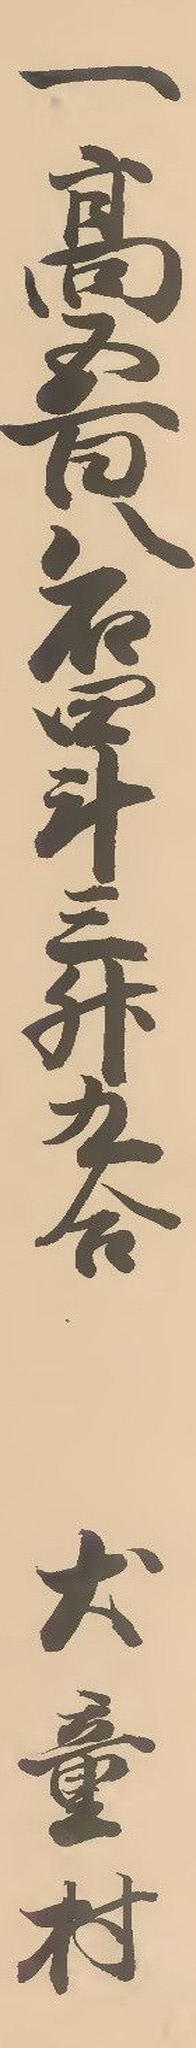一髙五百八石四斗三升九合犬童村
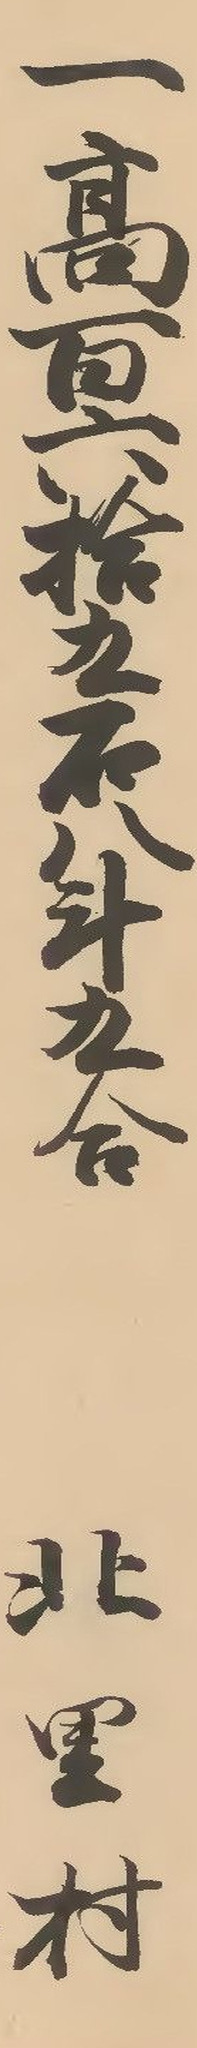一髙百六拾九石八斗九合北里村
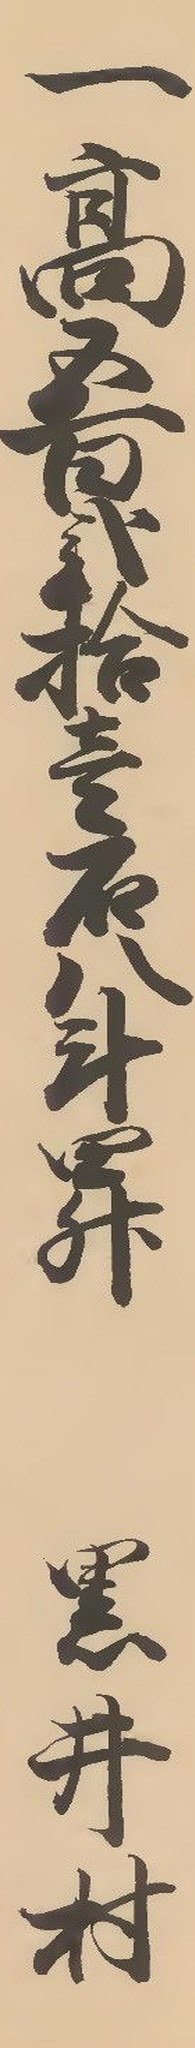一髙五百弐拾壱石八斗四升黑井村
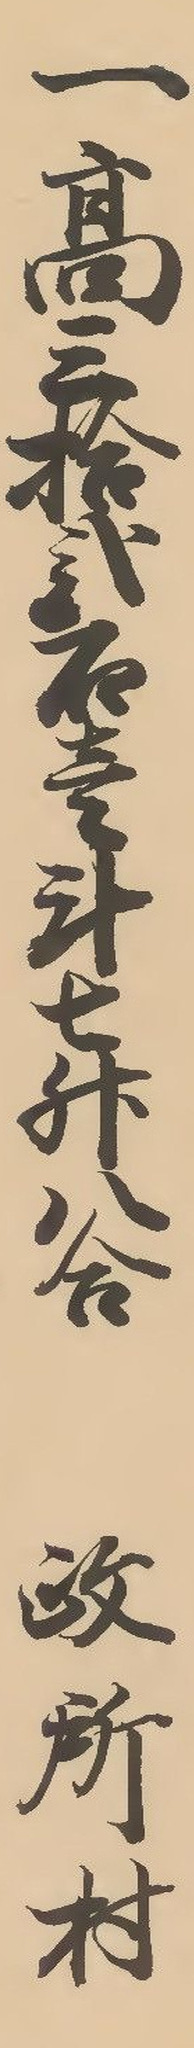一髙三拾弐石壱斗七升八合政所村

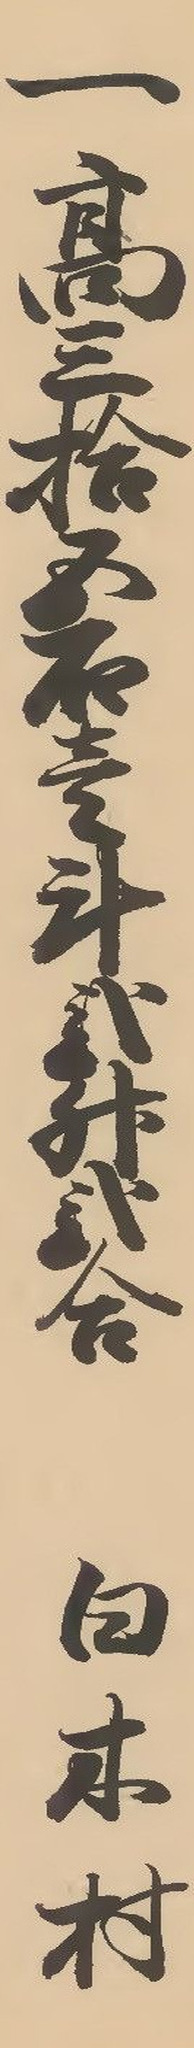一髙三拾五石壱斗弐升弐合白木村
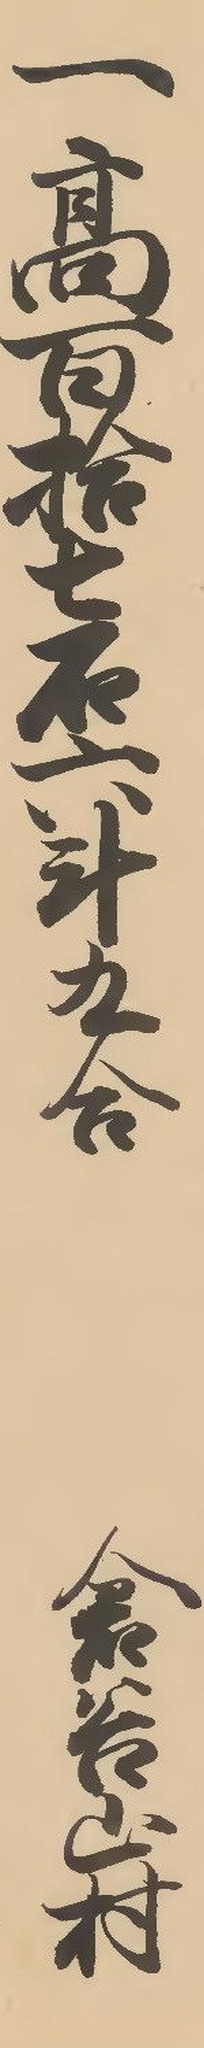一髙百拾七石六斗九合倉谷山村
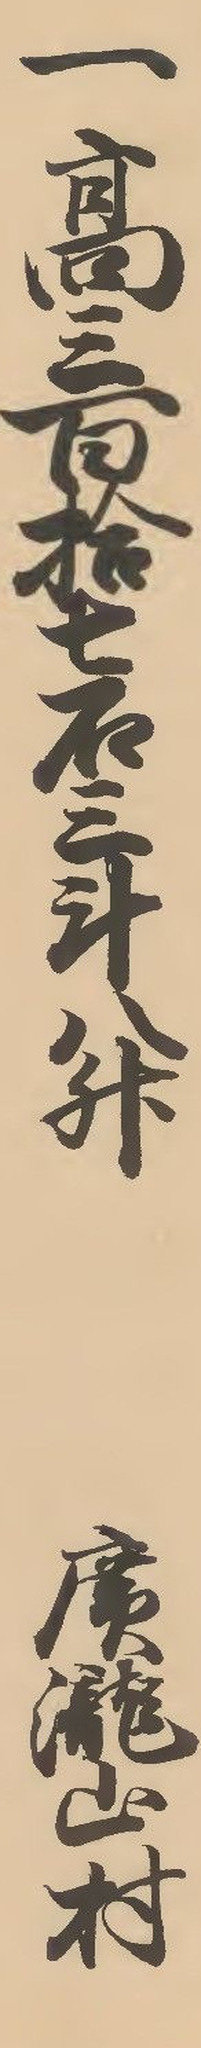一髙三百拾七石三斗八升廣瀧山村
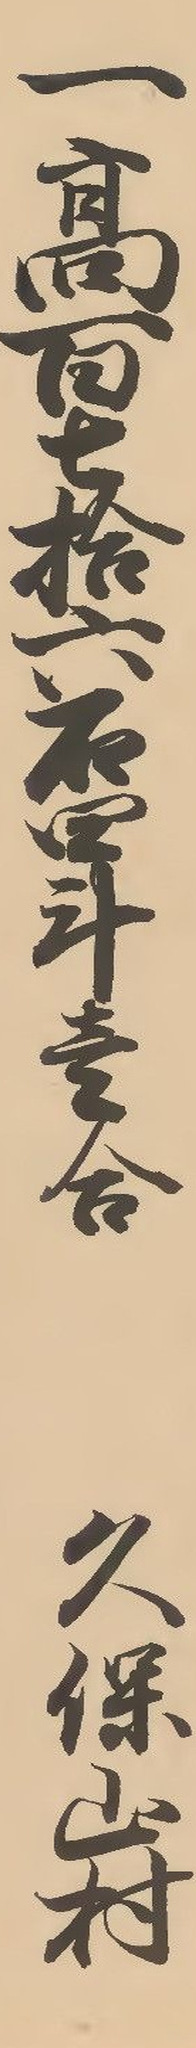一髙百七拾六石四斗壱合久保山村
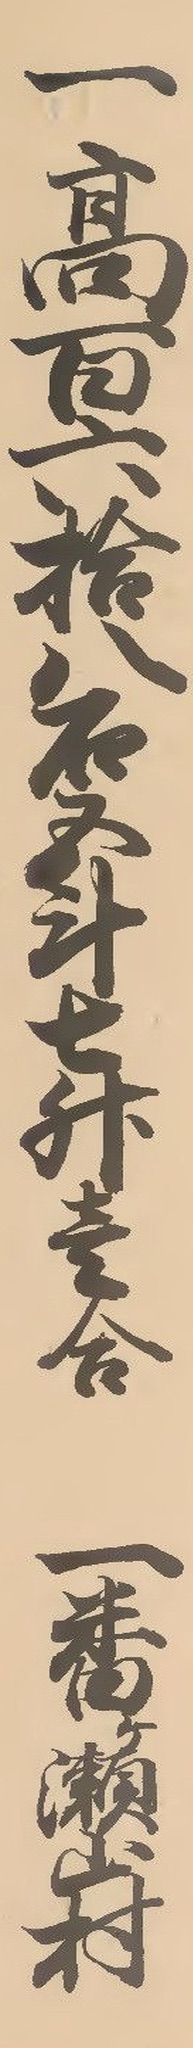一髙百六拾八石五斗七升壱合一番ケ瀬山村
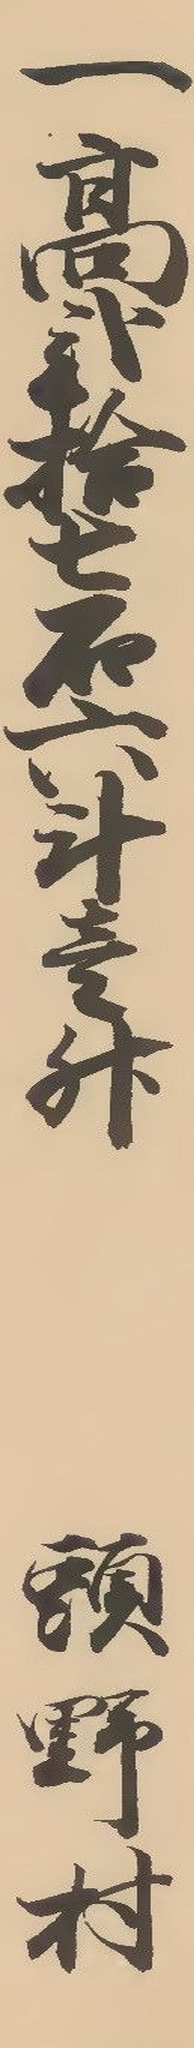一髙弐拾七石六斗壱升頭野村
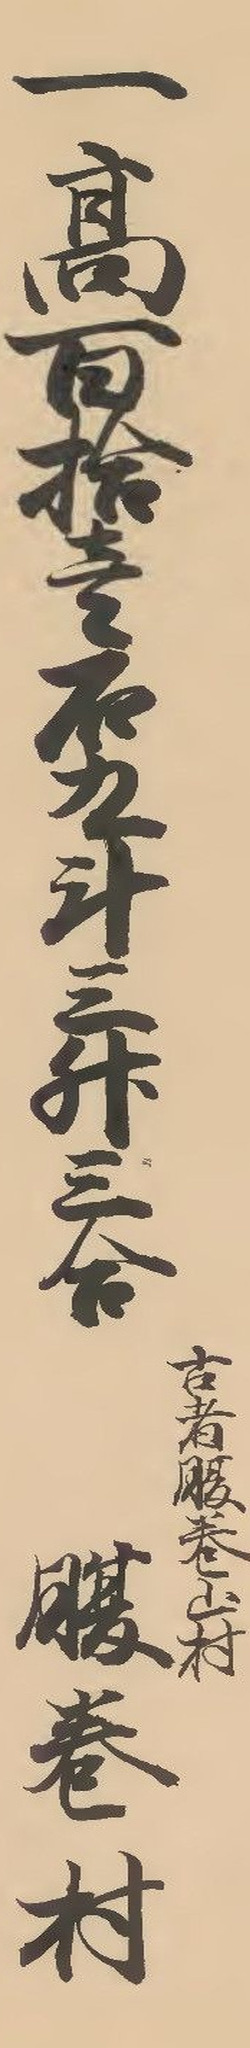一髙百拾壱石九斗三升三合腹巻村
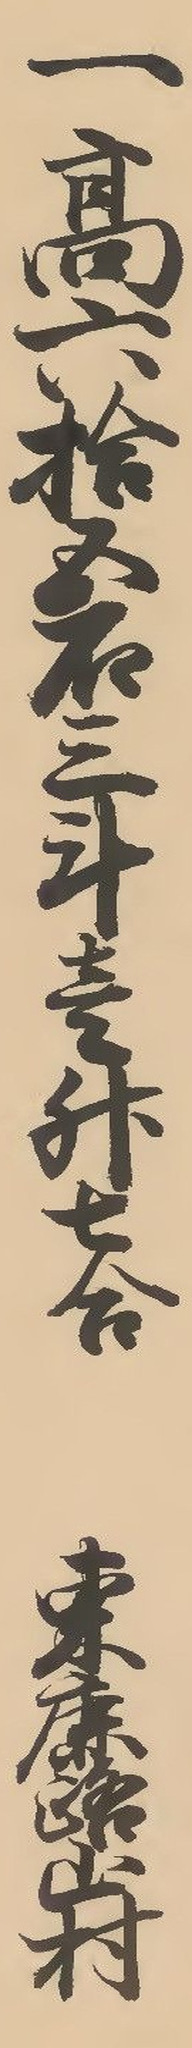一髙六拾五石三斗壱升七合東鹿路山村

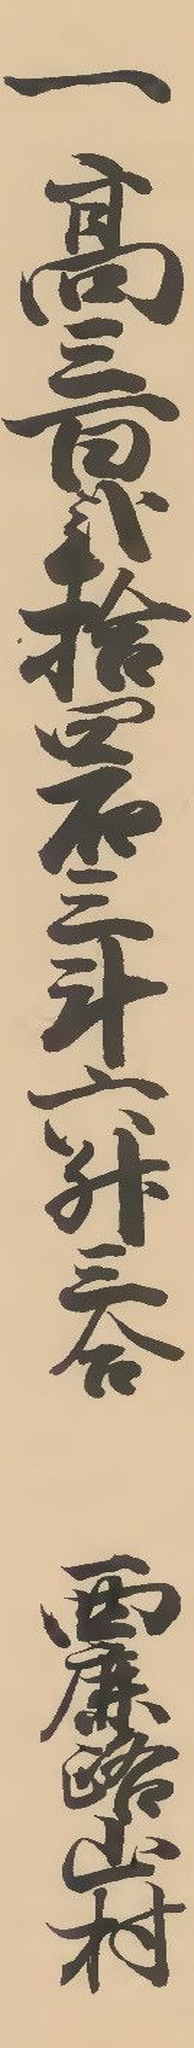一髙三百弐拾四石三斗六升三合西鹿路山村
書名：肥前国郷帳
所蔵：国立公文書館 National Archives of Japan
